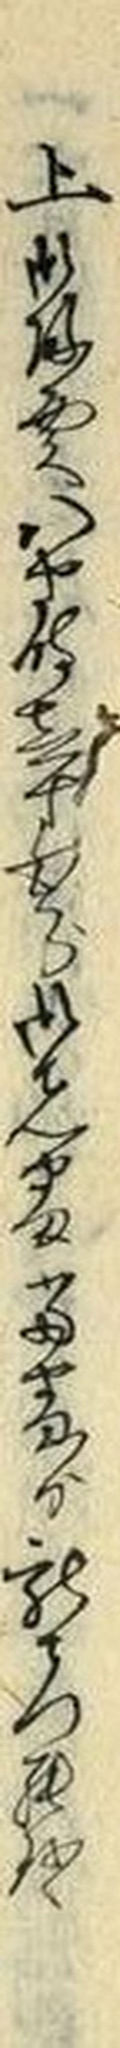上御帰殿八半時壱寸五分御先番当番ゟ新右衛門罷越候
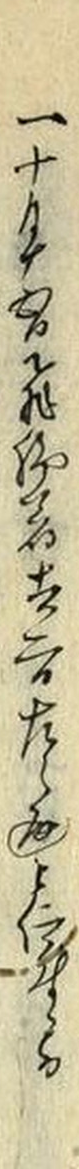一十月十五日飛脚着去二日左之通被仰付候
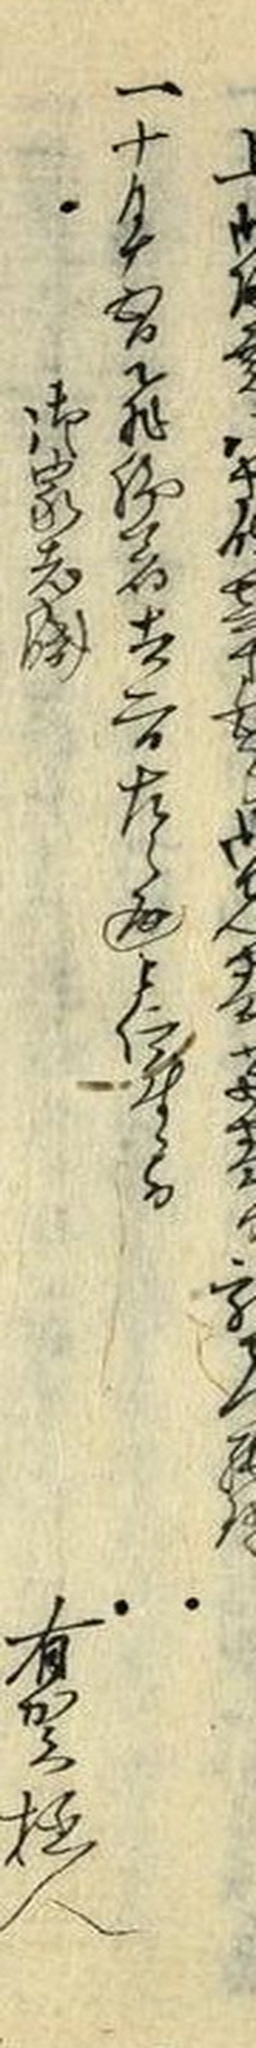御家老職有賀極人
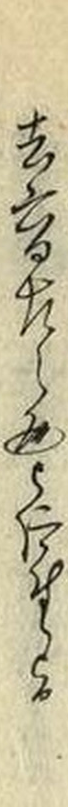去六日左之通被仰付候
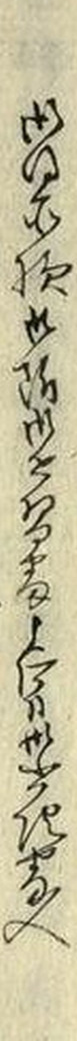御同所様御附御近習番被仰付松原四郎兵衛
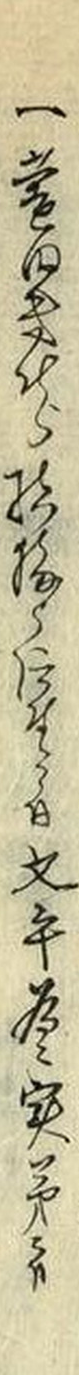一薗田幾次郎結構被仰付候ニ付文平薗田幾次郎
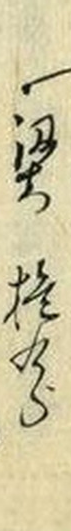梁権九郎
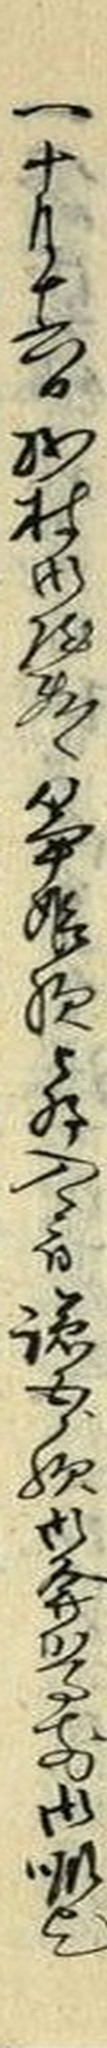一十月十六日砂村御屋敷へ箏姫様被為入候ニ付謙五郎様御発駕前御暇迄
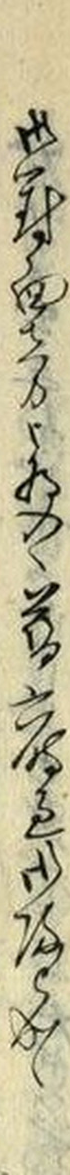御対面旁被為入候暮六時過御帰被成候
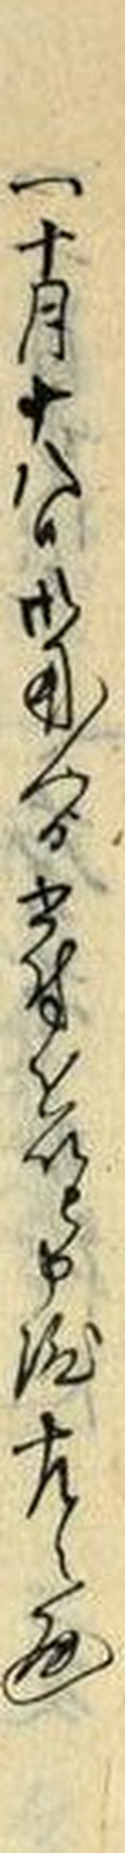一十月十八日御用人ゟ書付を以被申渡左之通
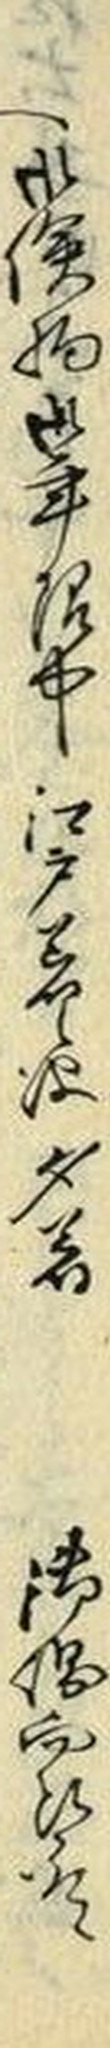御倹約御年限中江戸着之儀夕着御側向頭取へ
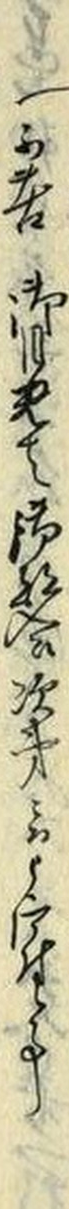不苦御目見は御都合次第ニ而被仰付候事
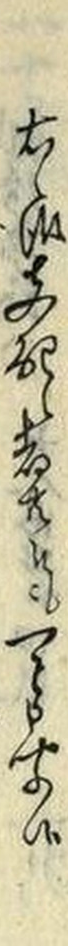右之趣支配之者共江も可被申聞候
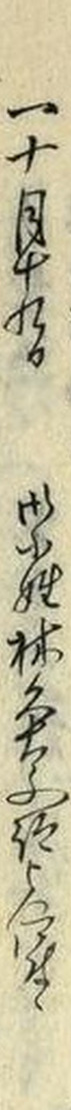一十月十九日御小姓林久太夫跡被仰付候
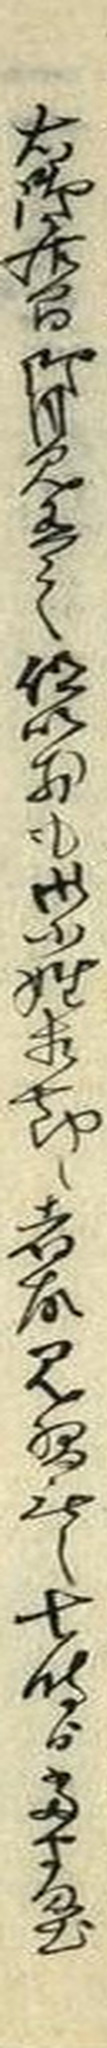右御居間御目見有之但以前も御小姓相勤候者故見習無之七時ゟ当番出
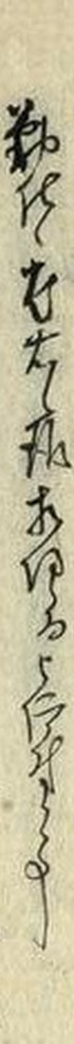勤仕候尤右之趣相伺候而被仰付候事
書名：少傅日録抄（斉承付側向頭取日記、在府）
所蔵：福井県文書館 Fukui Prefectural Archives
